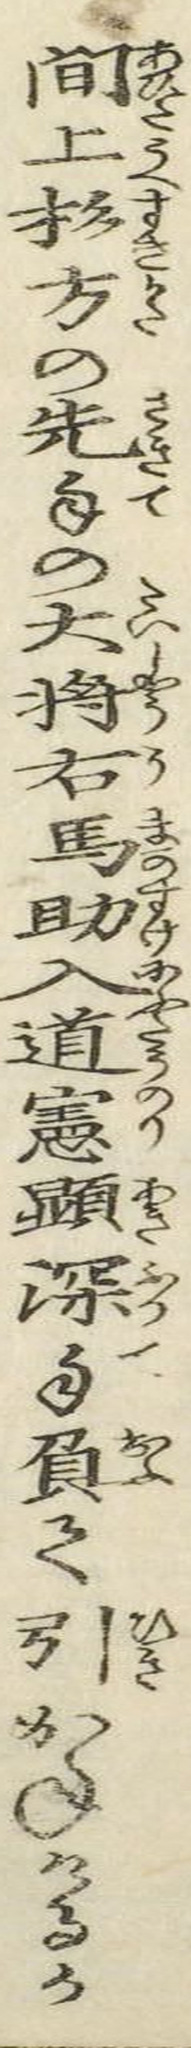間上杉方の先手の大将右馬助入道憲顕深手負て引かねけるか
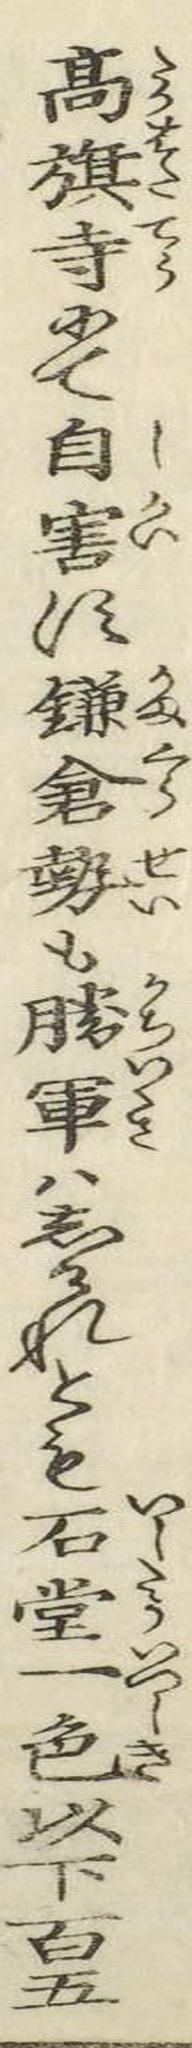高籏寺にて自害す鎌倉勢も勝軍はしかれとも石堂一色以下百五
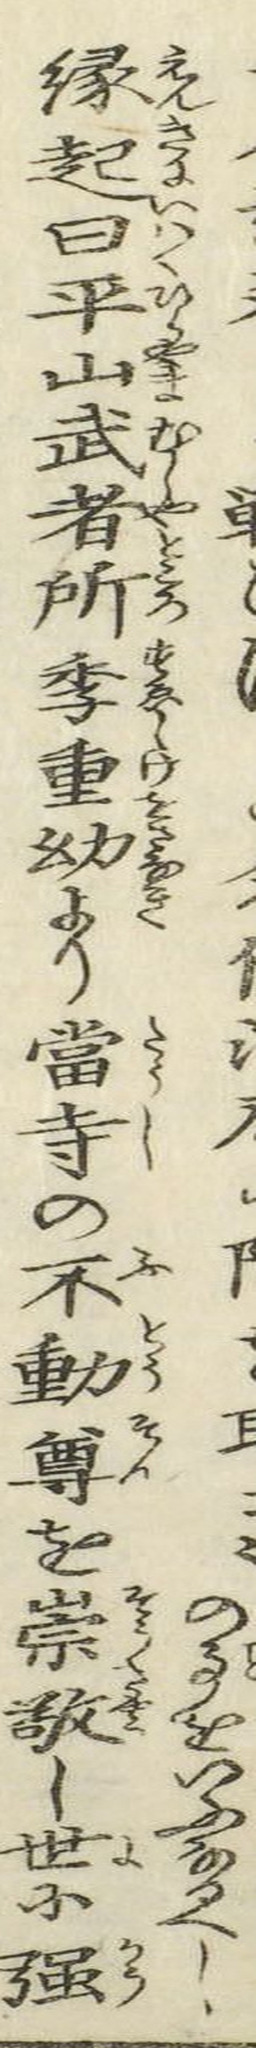縁起曰平山武者所季重幼より当寺の不動尊を崇敬し世に強
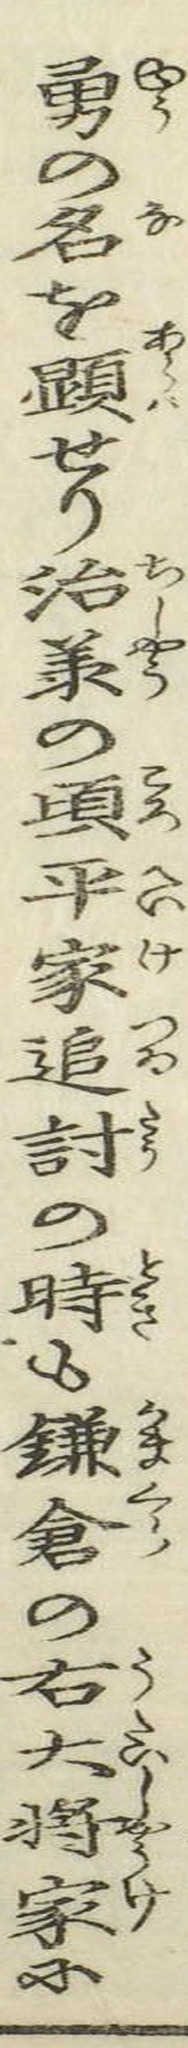勇の名を顕せり治承の頃平家追討の時も鎌倉の右大将家に
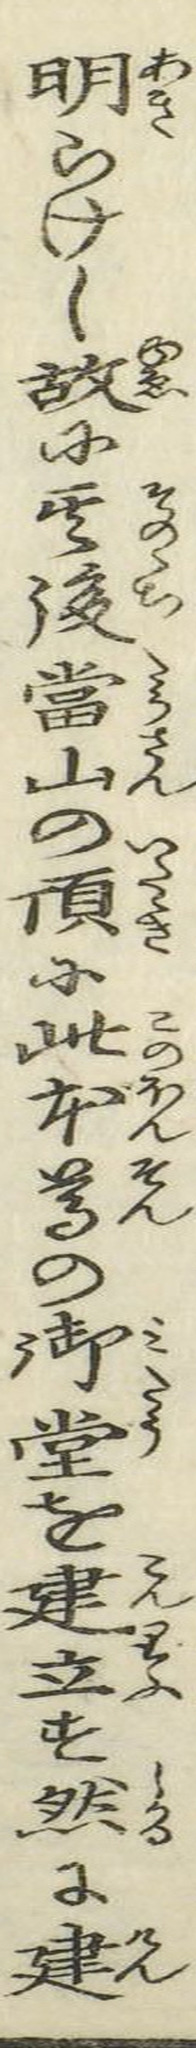明らけし故に其後当山の頂に此本尊の御堂を建立す然に建
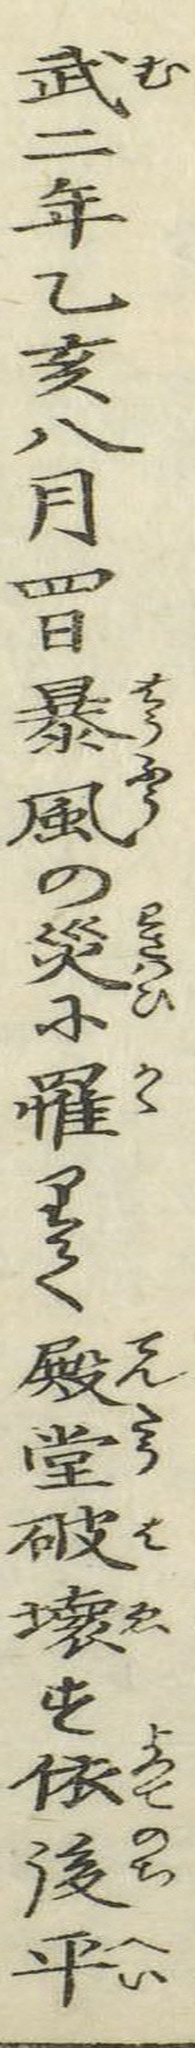武二年乙亥八月四日暴風の災に罹りて殿堂破壊す依後平
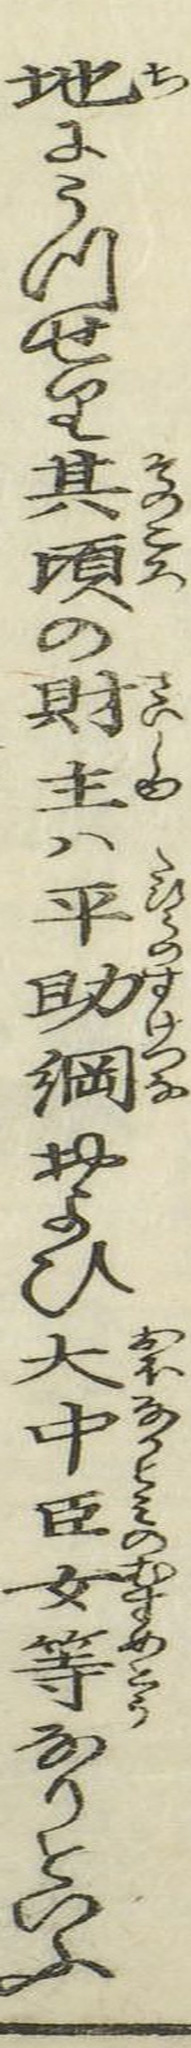地にうつせり其頃の財主は平助綱およひ大中臣女等なりといふ
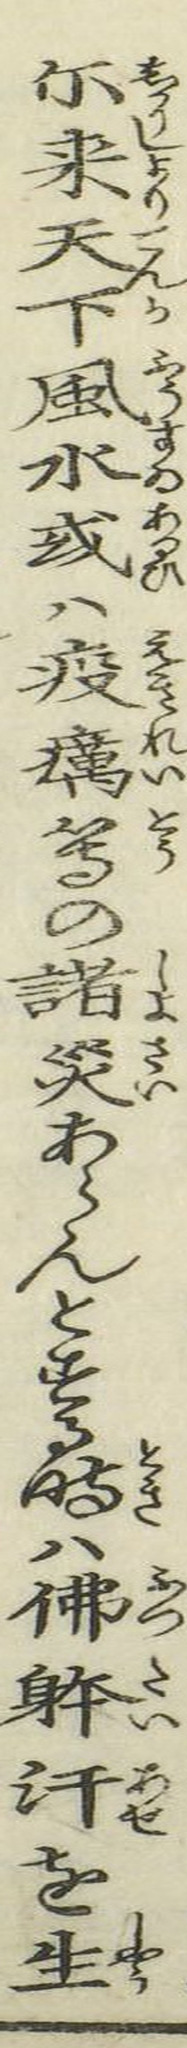尓来天下風水或は疫癘等の諸災あらんとする時は佛躰汗を生
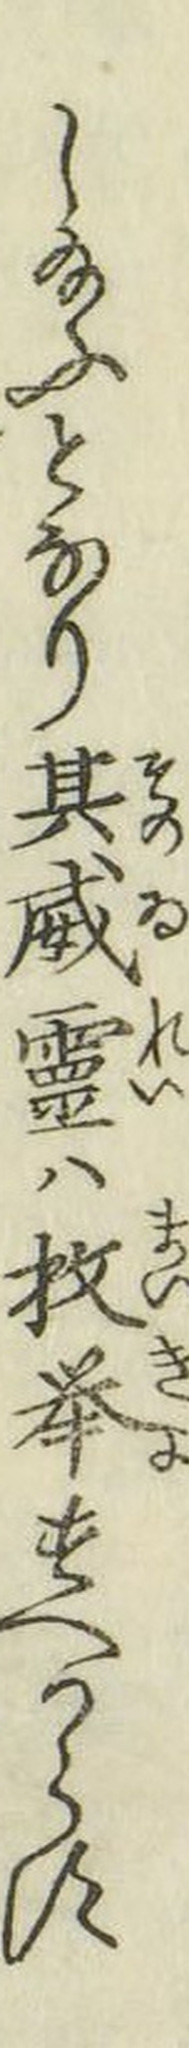し給ふとなり其威霊は枚挙すへからす

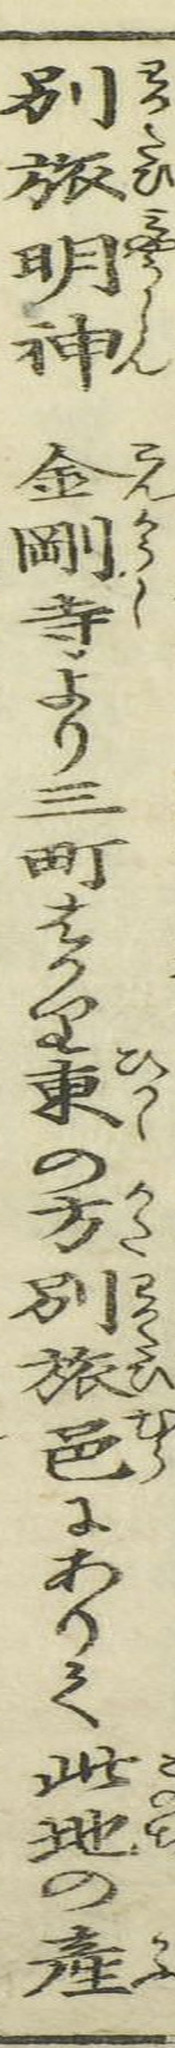別旅明神金剛寺より三町はかり東の方別旅邑にありて此地の産
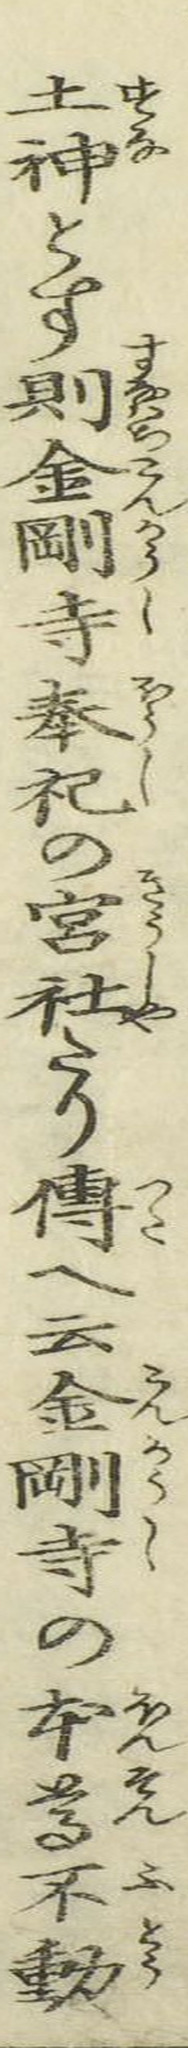土神とす則金剛寺奉祀の宮社たり傳へ云金剛寺の本尊不動
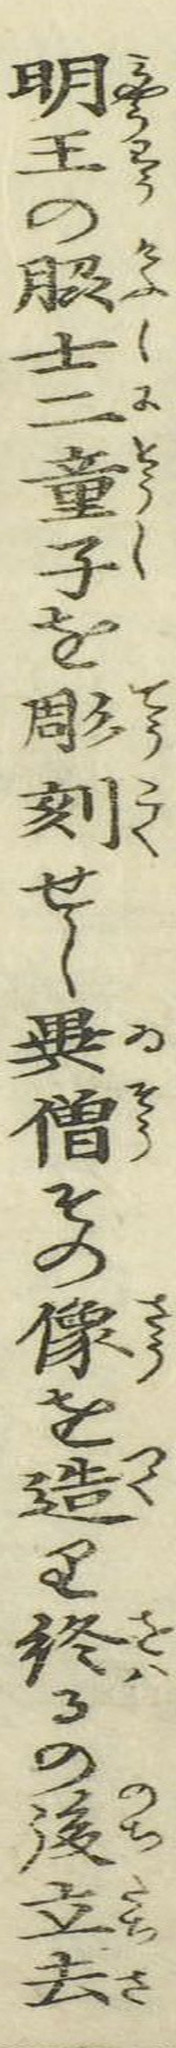明王の脇士二童子を彫刻せし異僧その像を造り終るの後立去
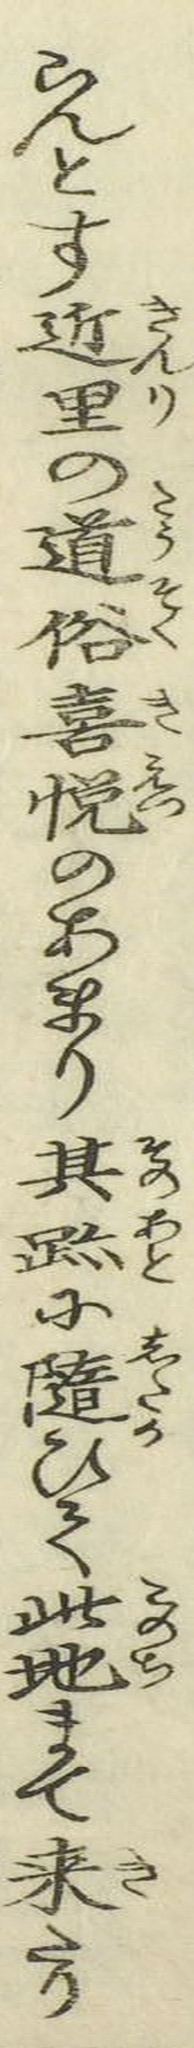らんとす近里の道俗喜悦のあまり其跡に随ひて此地まて来たり
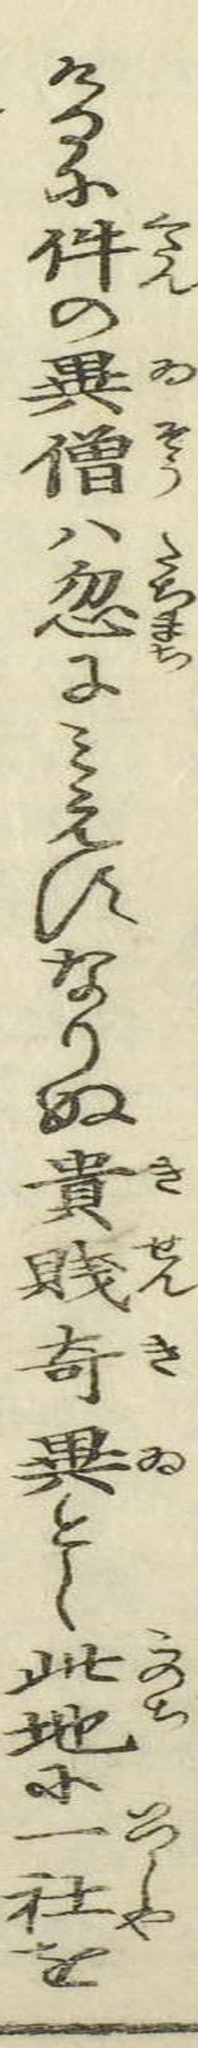けるに件の異僧は忽にみえすなりぬ貴賤奇異とし此地に一社を
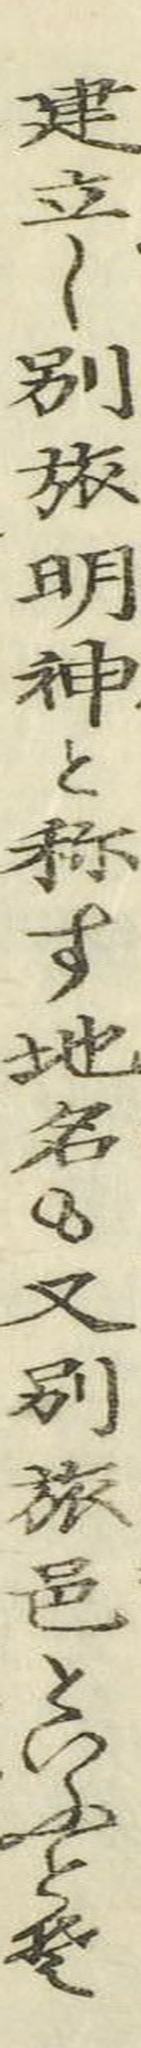建立し別旅明神と称す地名も又別旅邑といふとそ
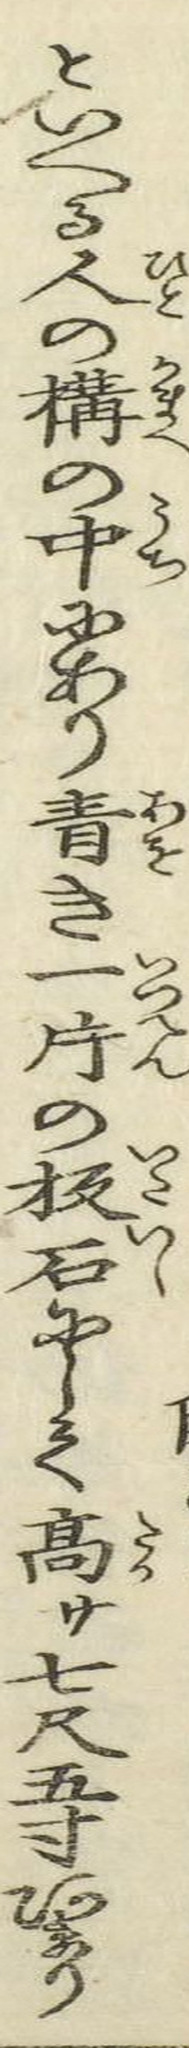といへる人の搆の中にあり青き一片の板石にして高サ七尺五寸あまり
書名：江戸名所図会 20巻 巻之10
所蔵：東京学芸大学教育コンテンツアーカイブ
